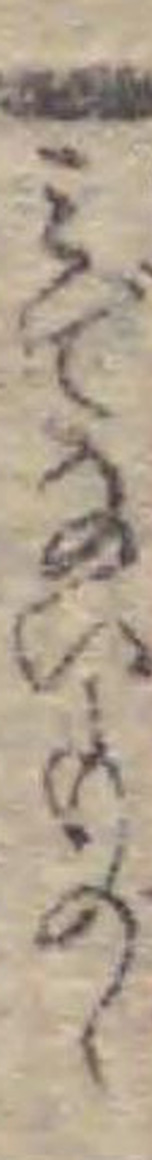みでないものゝ
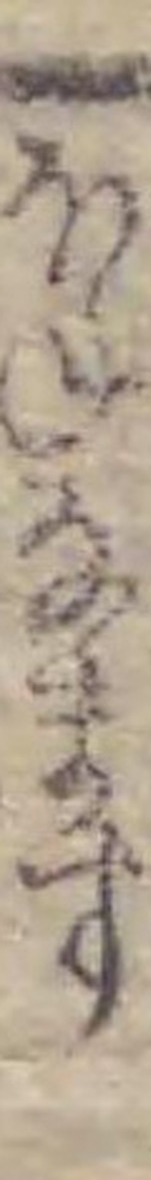ほねなます
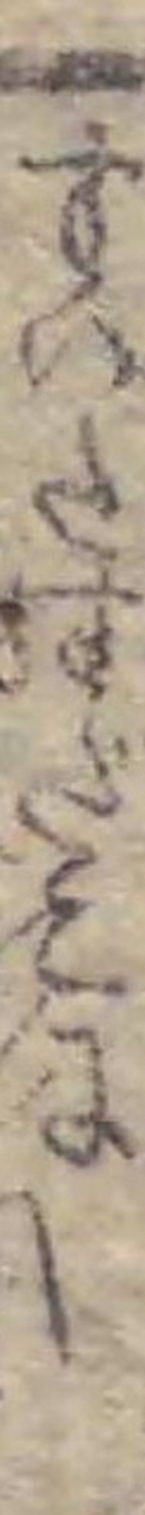すいたすだこに
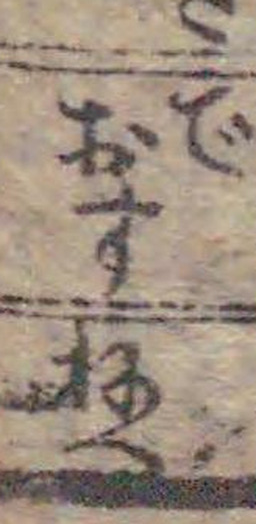おすねへ
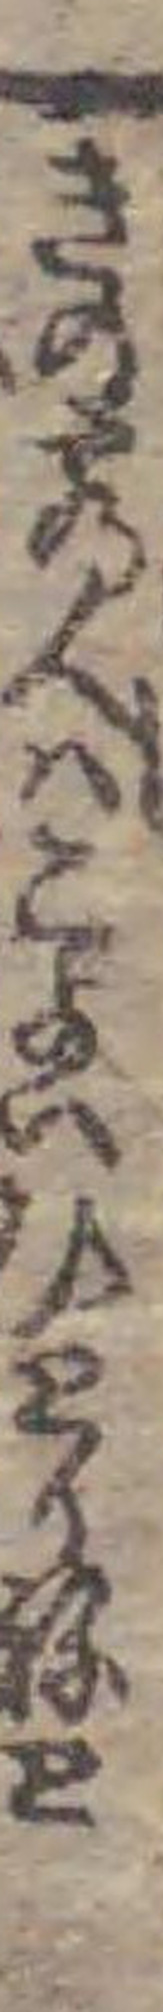きの客人はこよいひとりねと
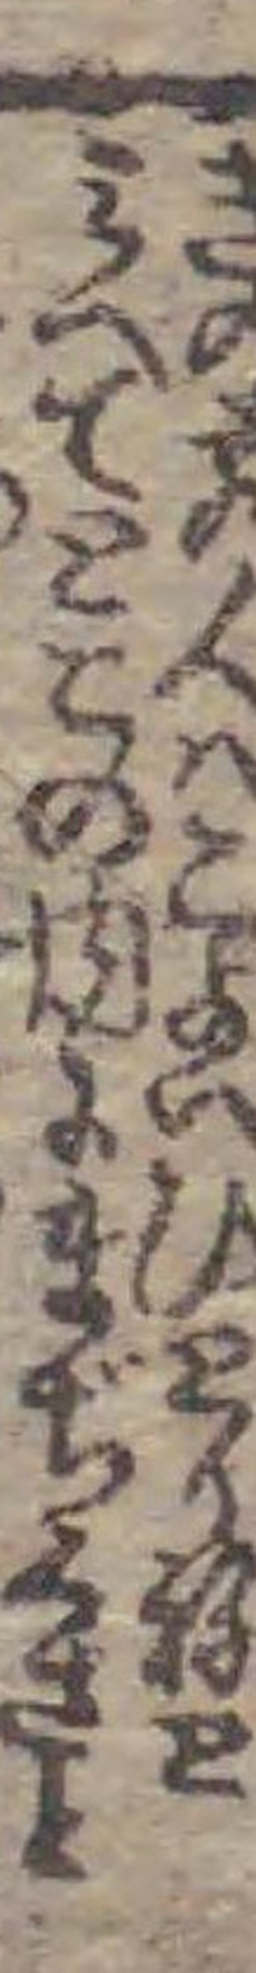みへてとこの内にまぢくさと
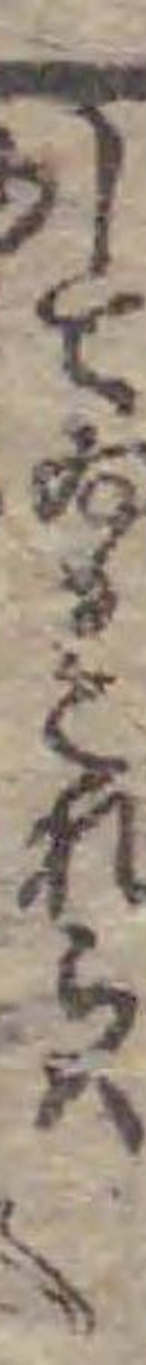してゐるこれらは
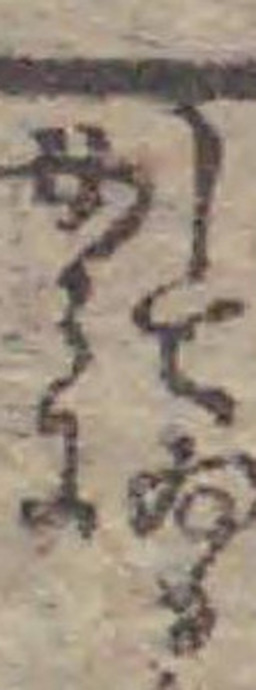女郎に
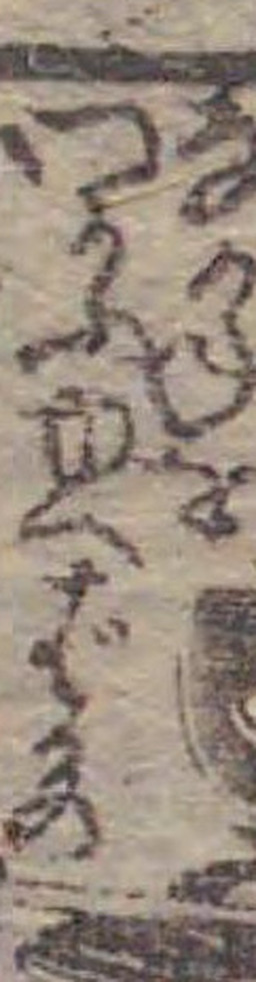つかふゆへばかの
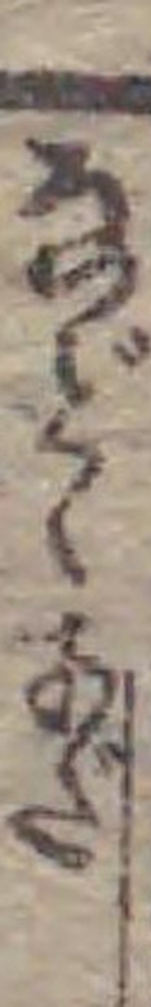などゝあだ
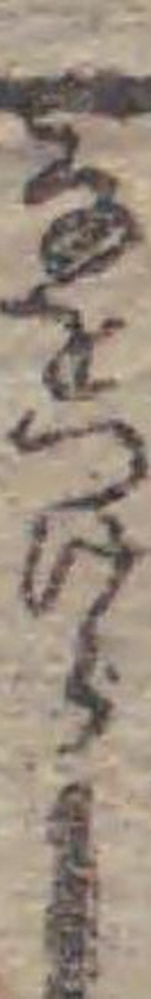なをつけら
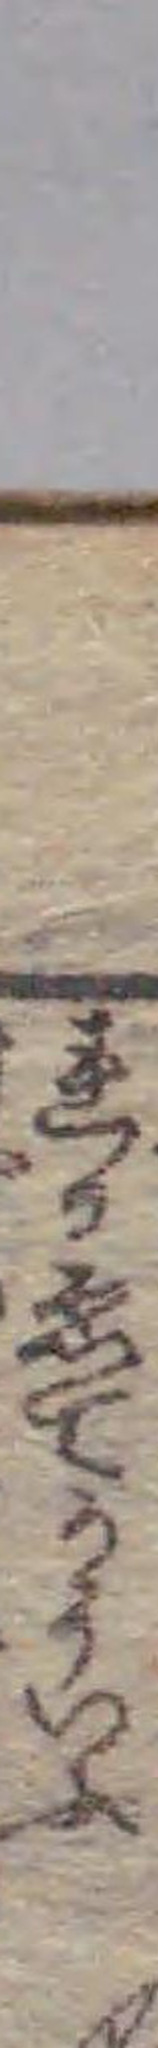れるゑてかういふ
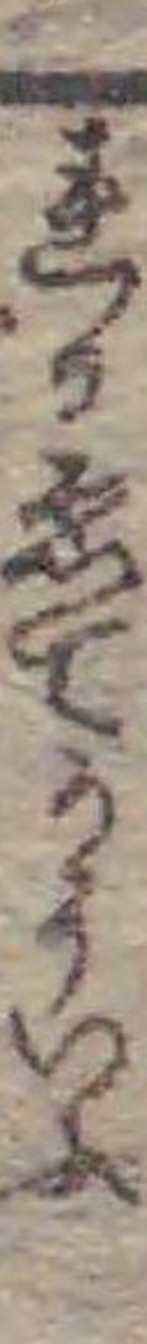れるゑてかういふ
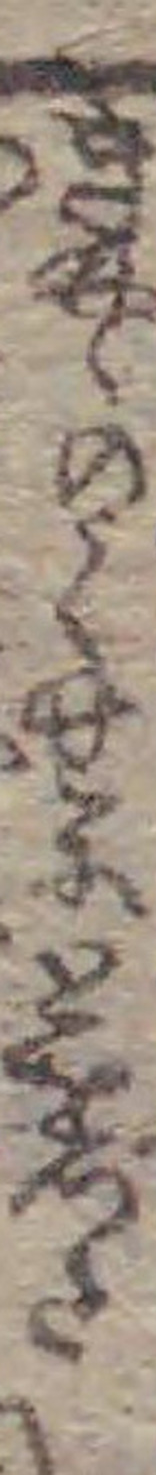きやくのくせにとをつた
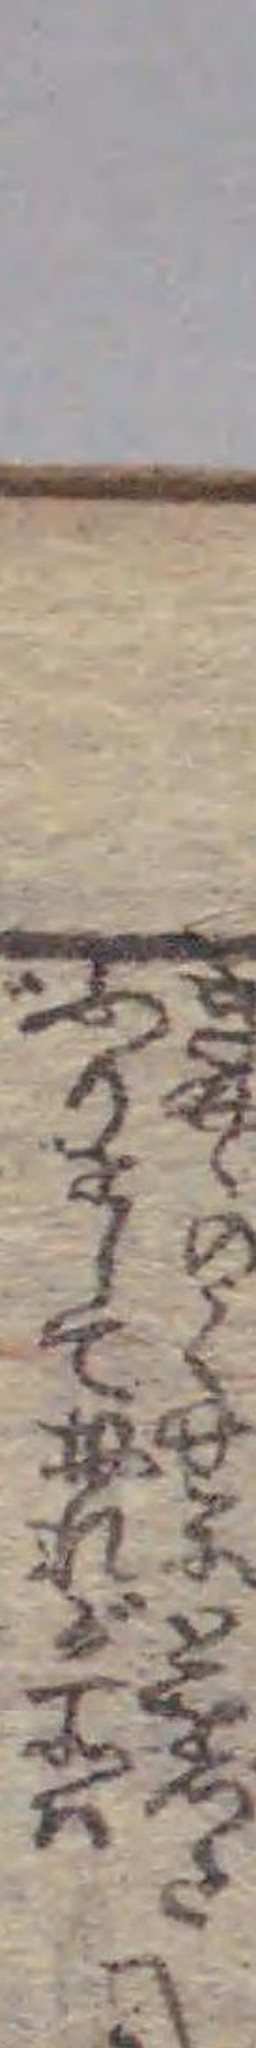ふりをしてかれが所は
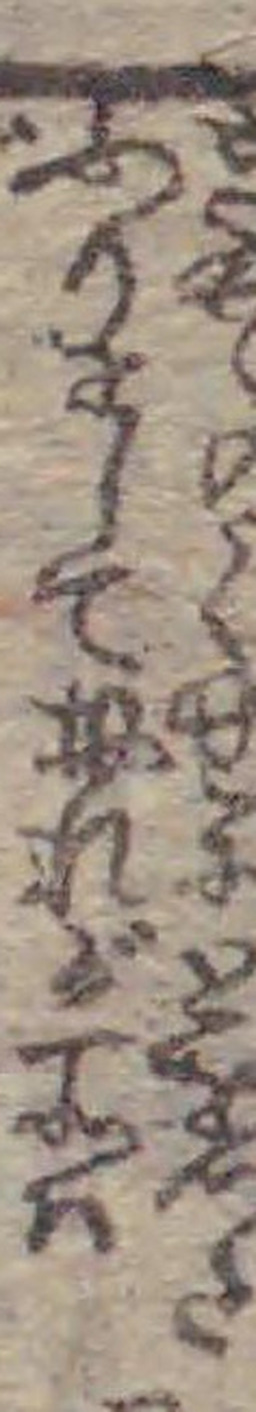ふりをしてかれが所は
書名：竜宮苦界玉手箱 : 3巻
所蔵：国立国会図書館 National Diet Library, JAPAN
